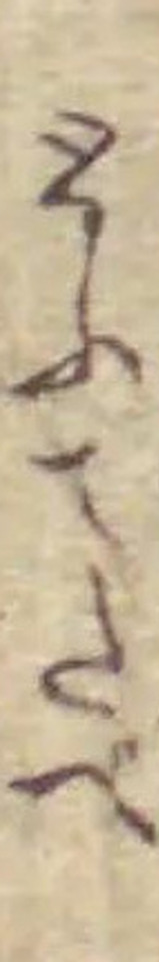とふてたべ

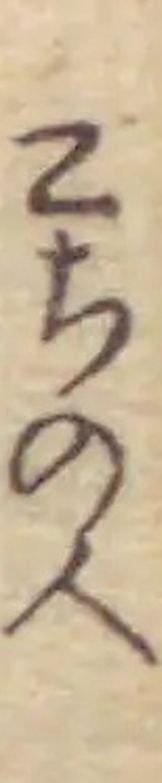こちの人
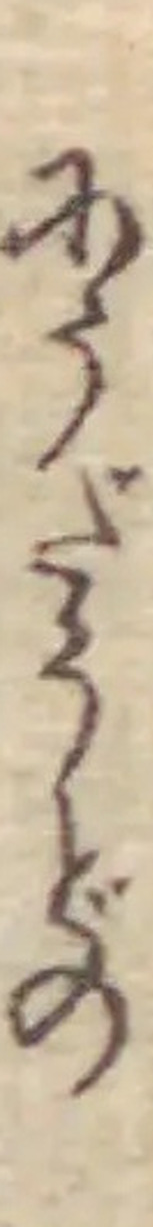にうだうどの
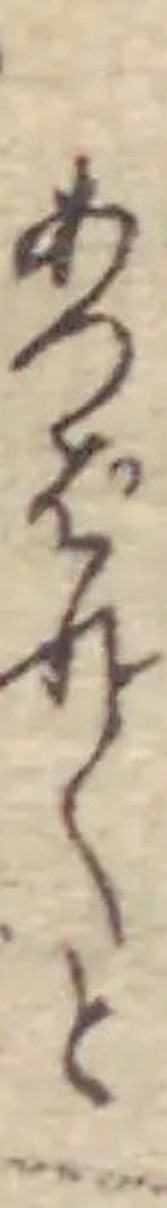あつぱれ〳〵と
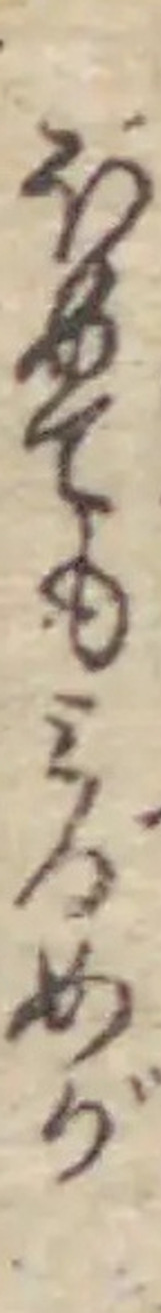ほめてもみるめが
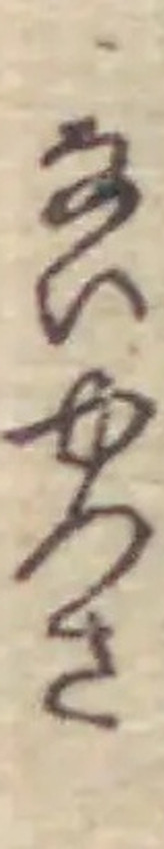ないやつさ
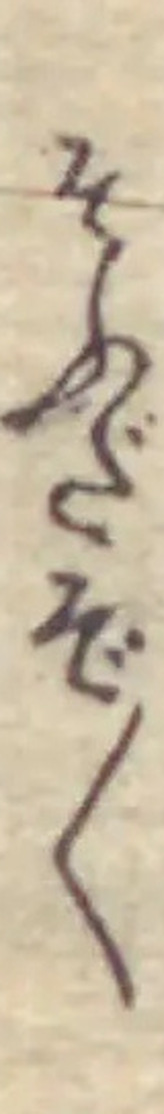そふだぞ〳〵
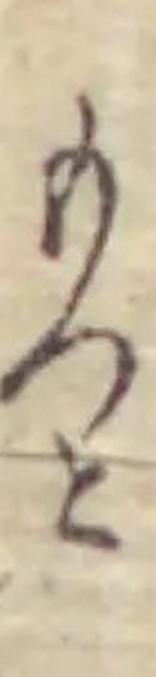もつと
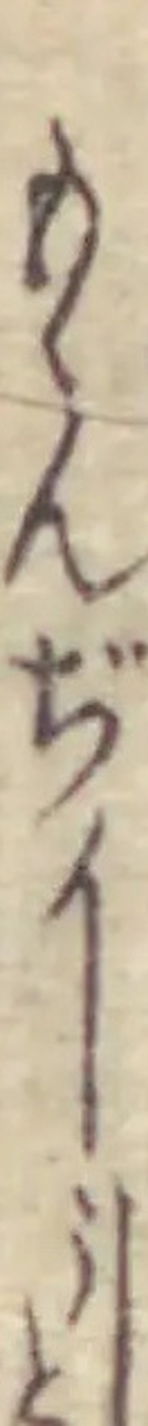もゝんぢイ引と
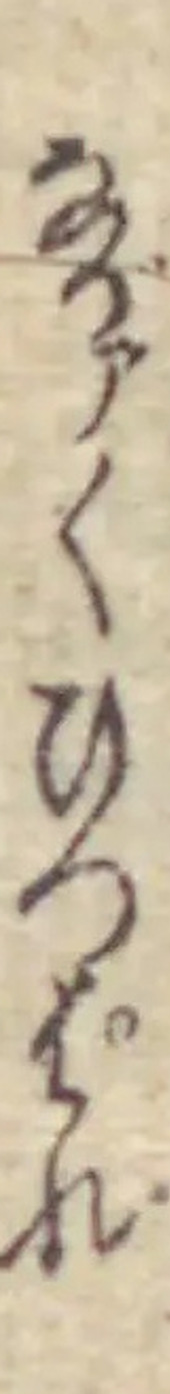ながァくひつぱれ
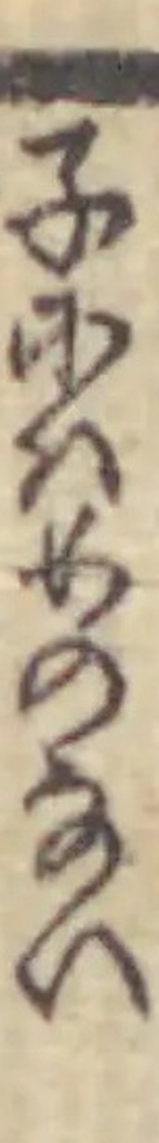子にはめのない
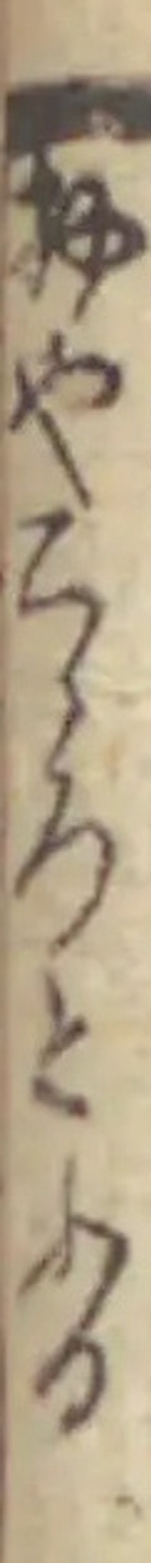おやこゝろとふる
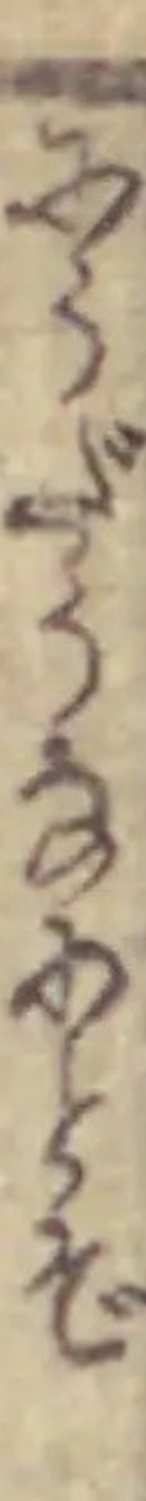にうだうなにとぞ
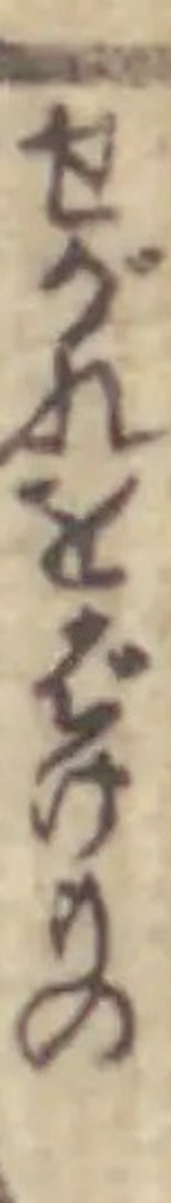せがれをばけもの
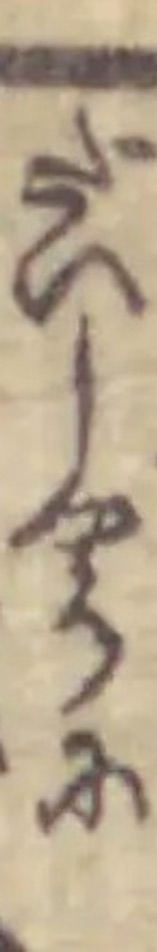だいしやうに
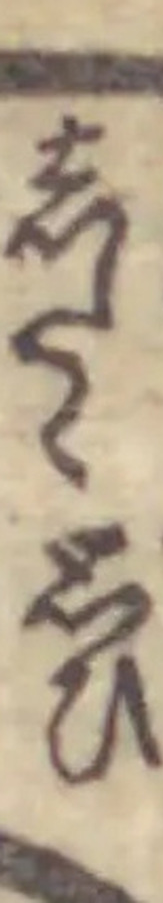したく思ひ
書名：大昔化物双紙 2巻
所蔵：国立国会図書館 National Diet Library, JAPAN
